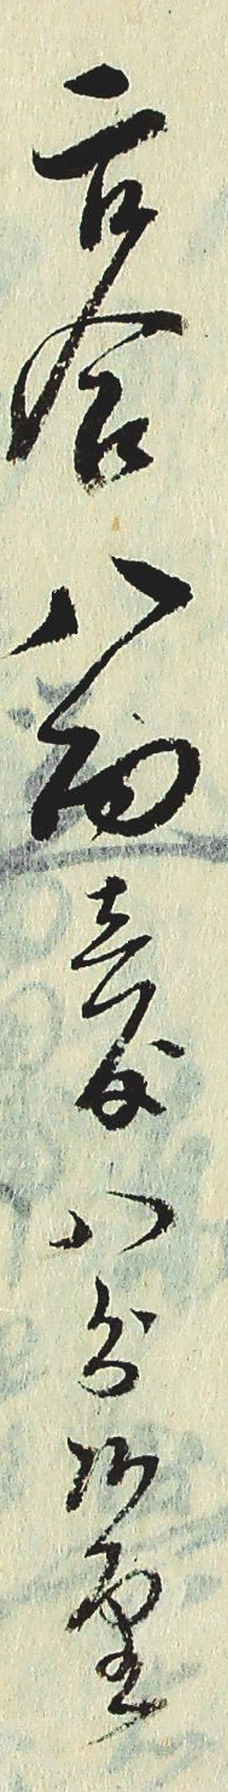二口合八百壱匁八分弐厘
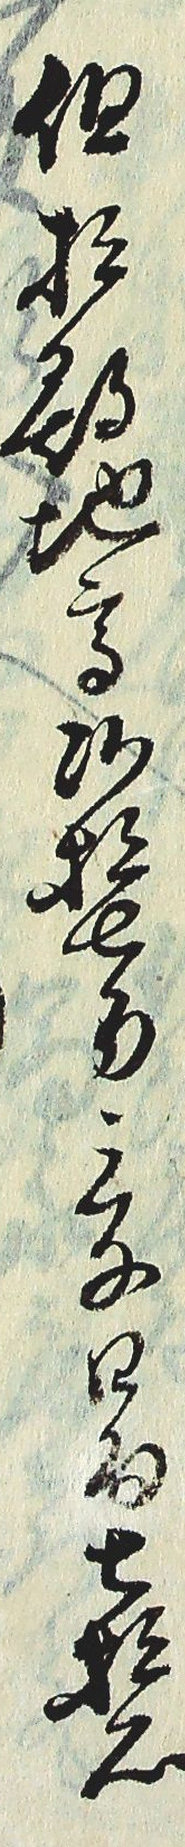但拾郡地高弐拾七万三千四百七拾石
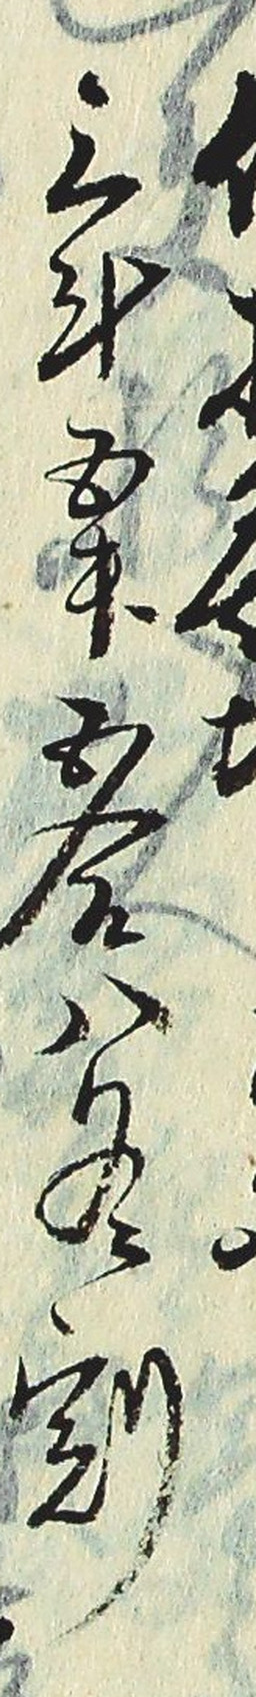三斗五升五合八勺に割
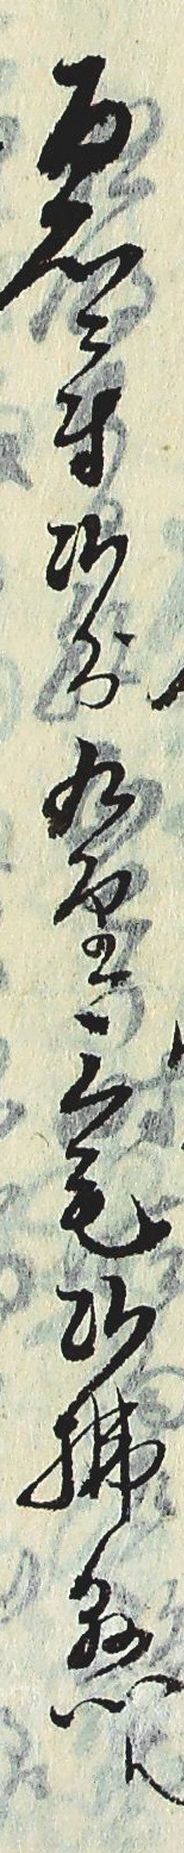百石に付弐分九厘三毛弐払懸る

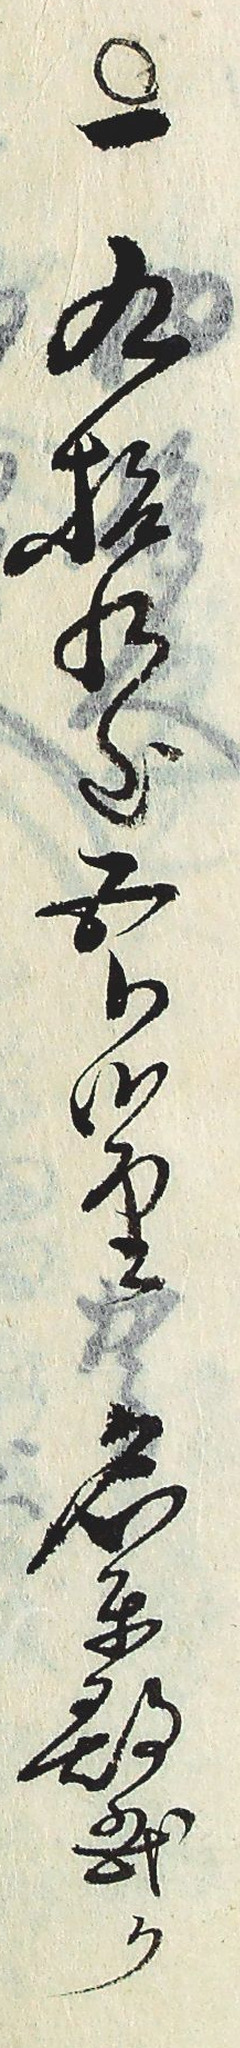一九拾九匁五分弐厘名東郡当り
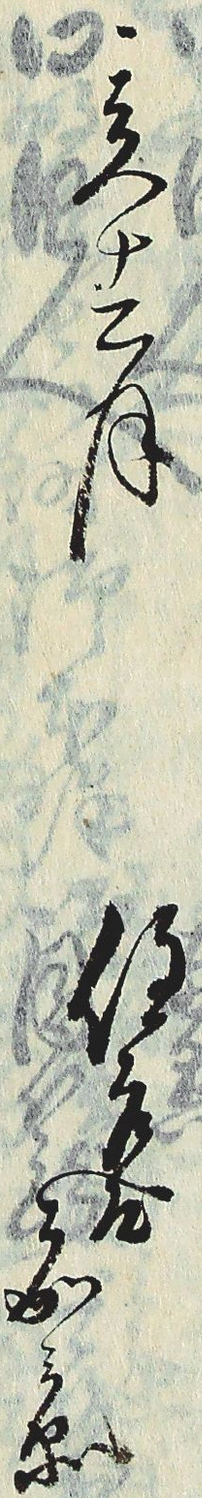亥十二月住吉屋
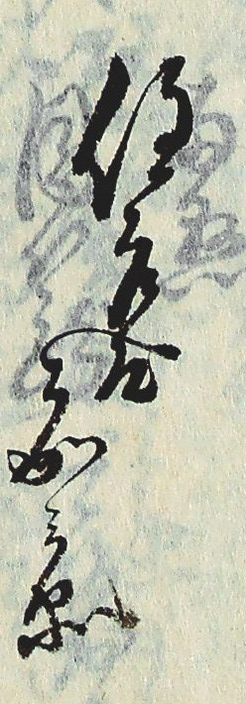後藤庄助様
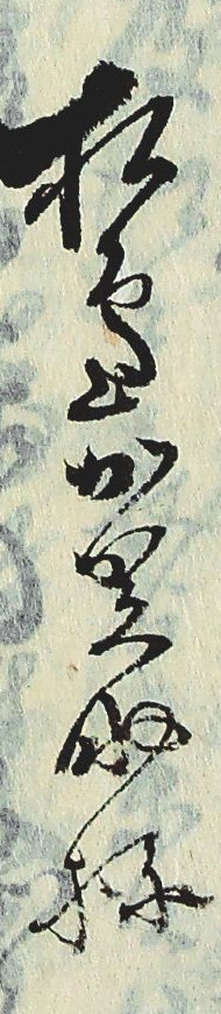松島加賀助様
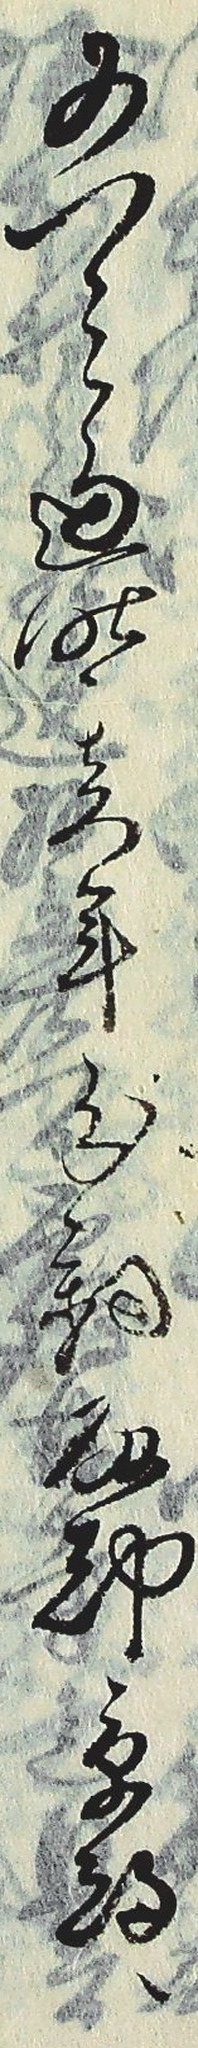右之通昨亥年分銅取都京都へ
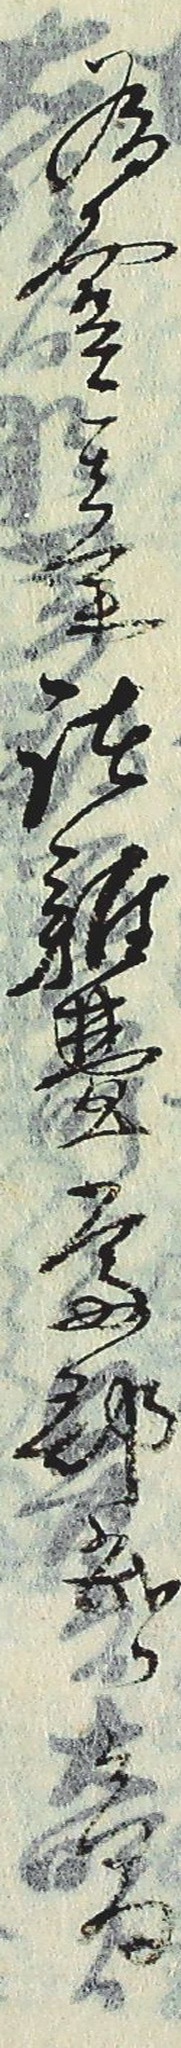為賈候其果諸雑費当郡当り候間
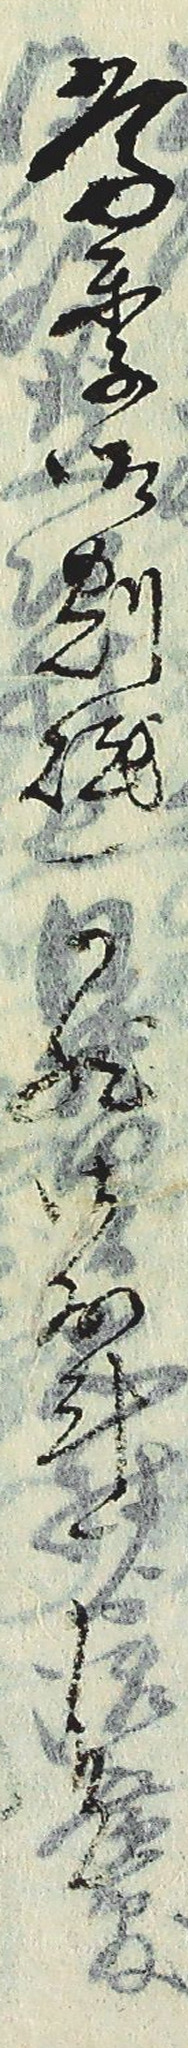当季御割賦可然御取計可被下候
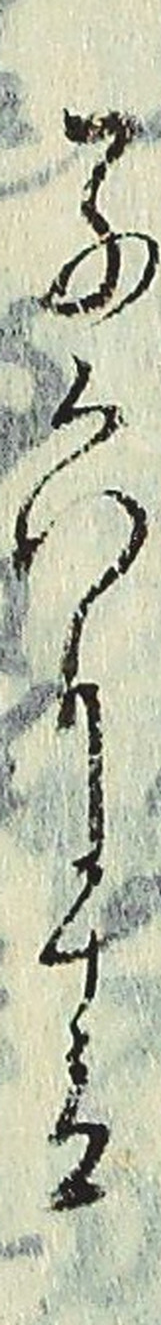子六月十二日
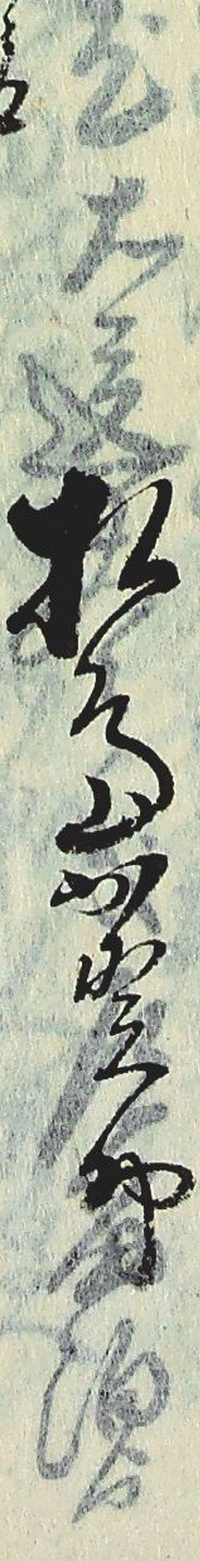松島加賀助
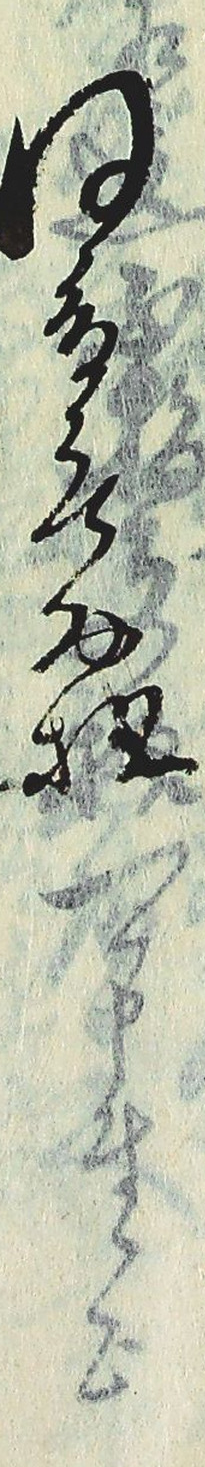後藤庄助様
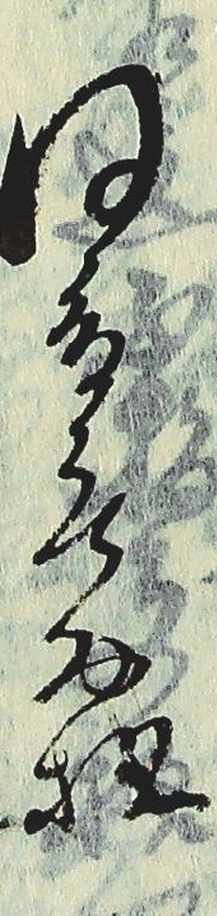後藤庄助様
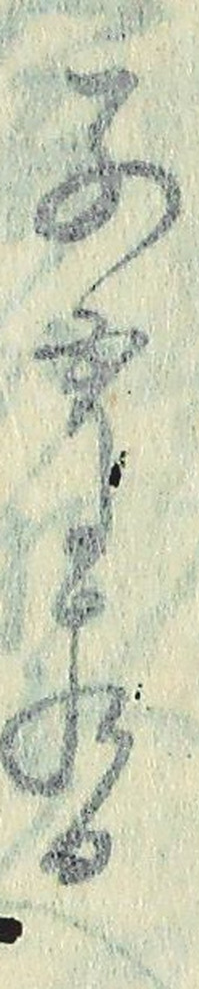子六月十二日
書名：名東郡中諸割賦元帳
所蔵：鳴門教育大学 Naruto University of Education
